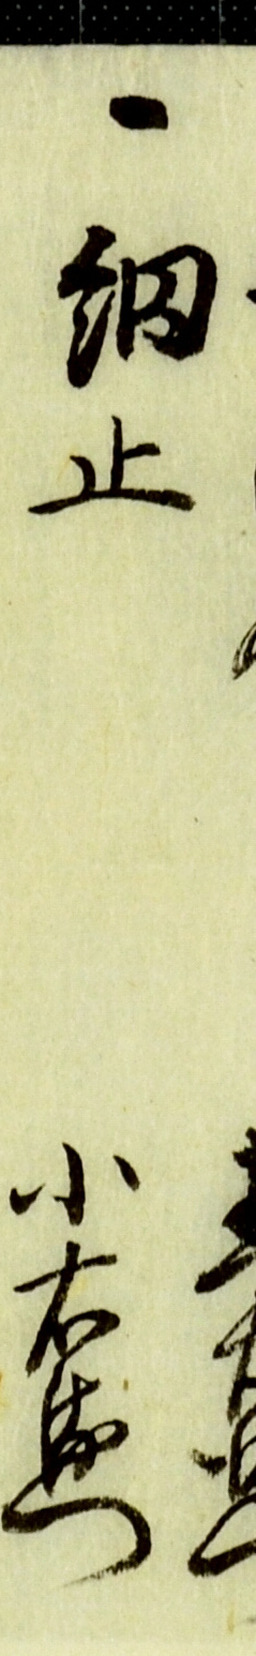一網止小右衛門
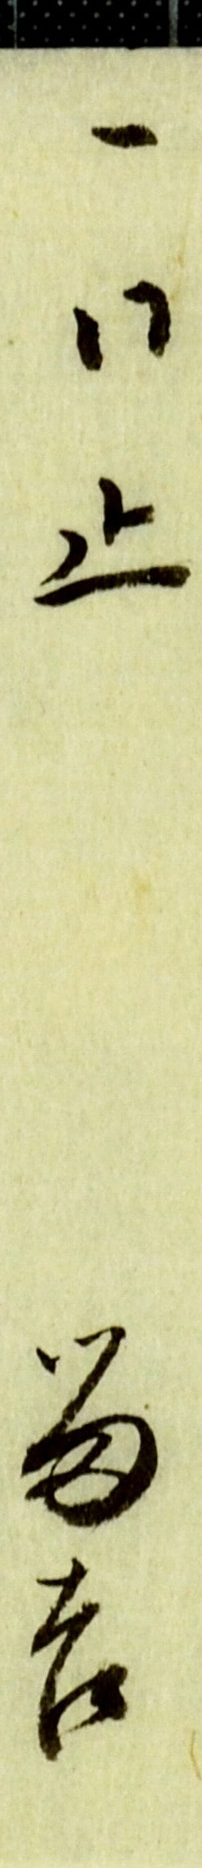一同止留吉
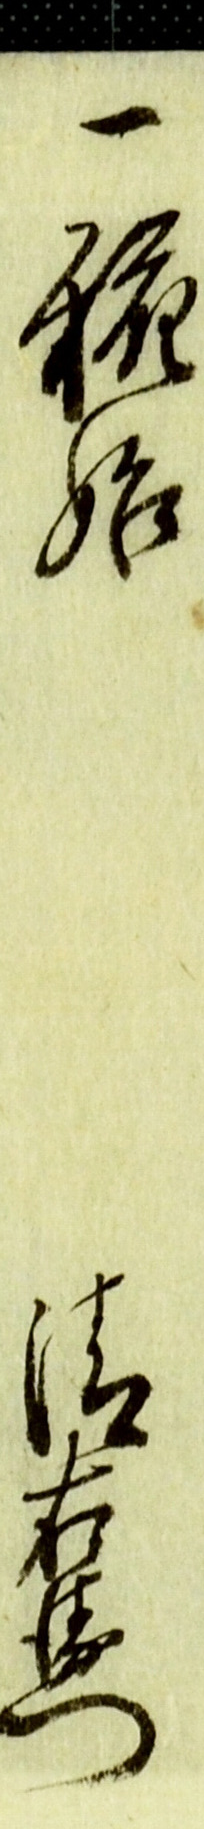一糀始清右衛門
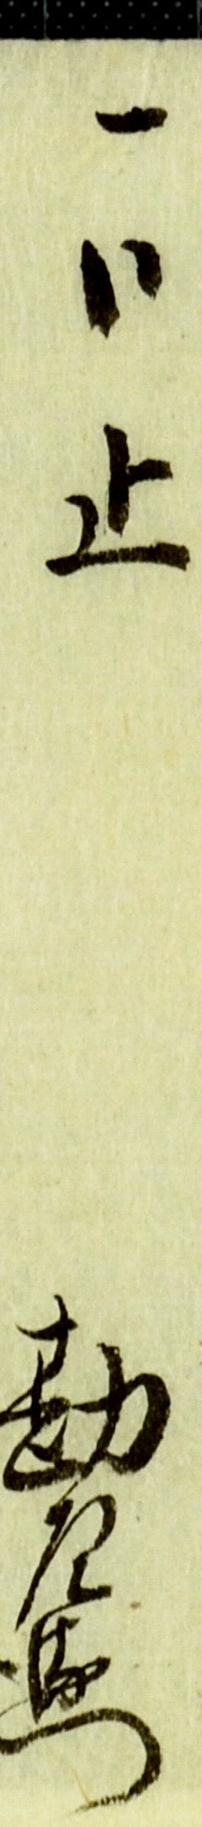一同止勘左衛門
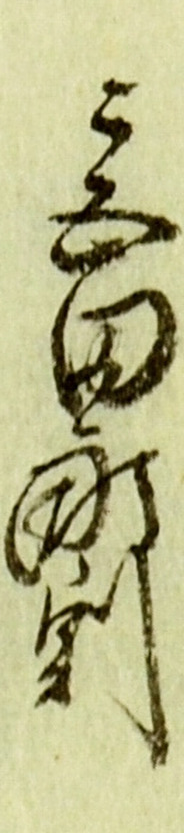宮田町割
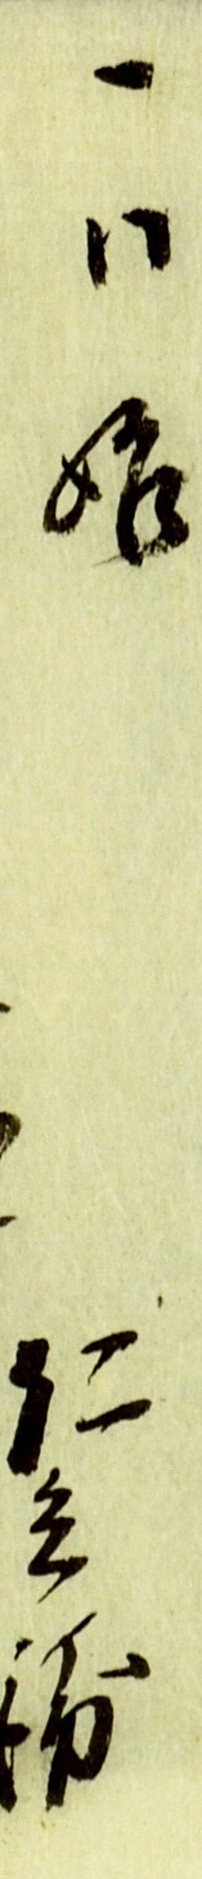一同始仁兵衛
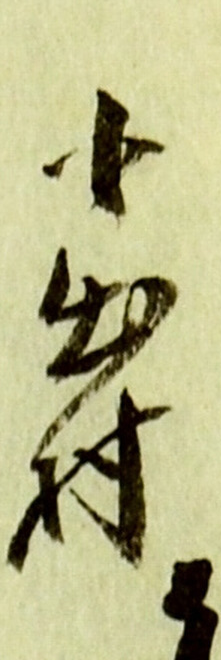小出村
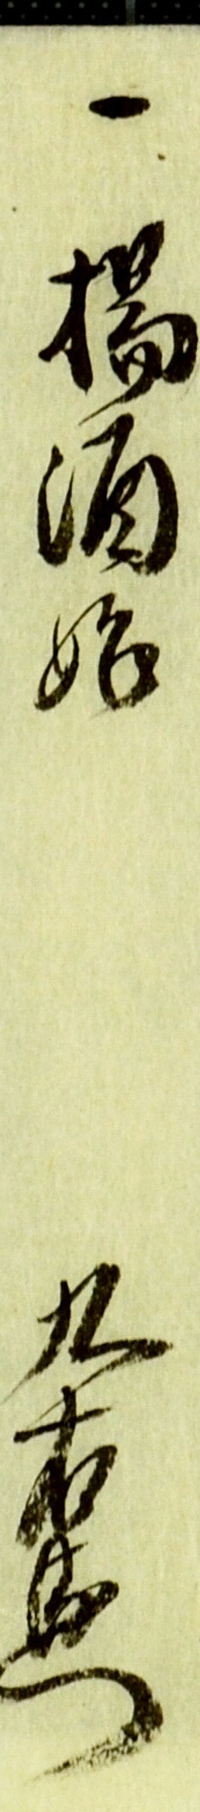一揚酒始九右衛門
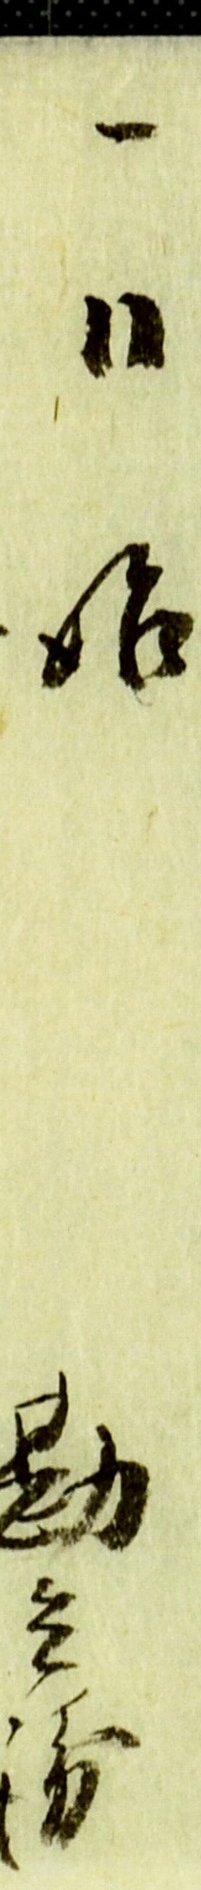一同始勘兵衛
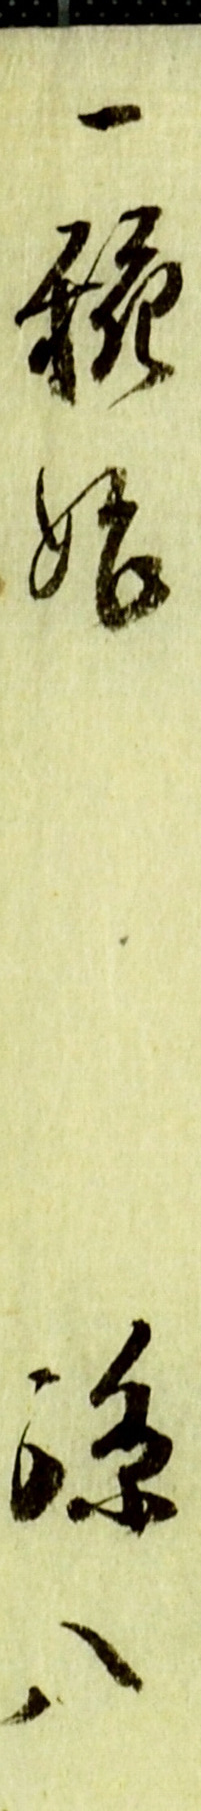一糀始孫八
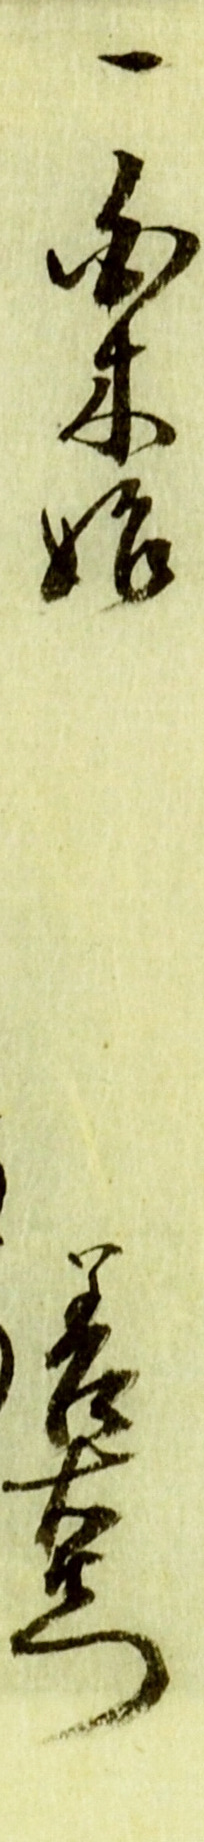一白木始善右衛門
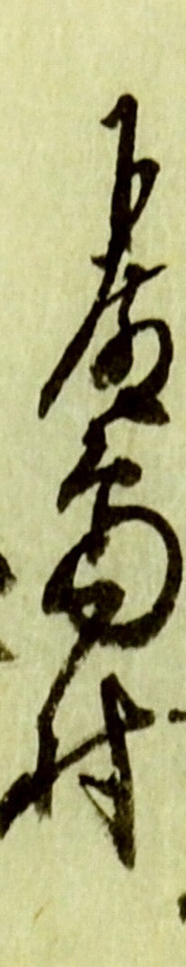下殿島村
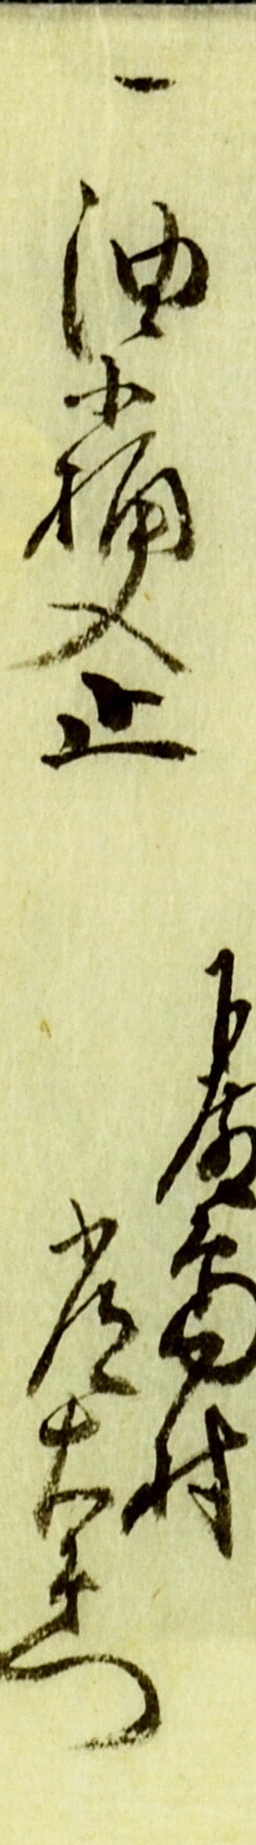一油小桶入止常右衛門
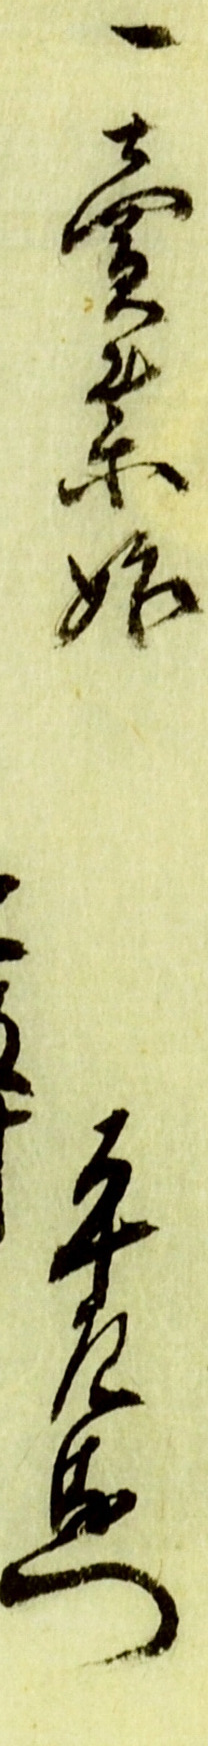一売薬始平左衛門
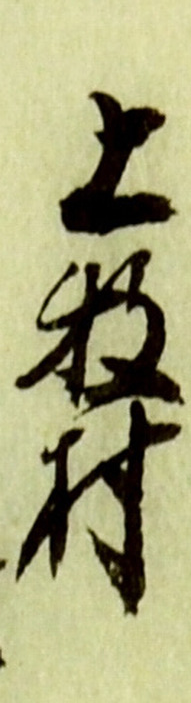上牧村
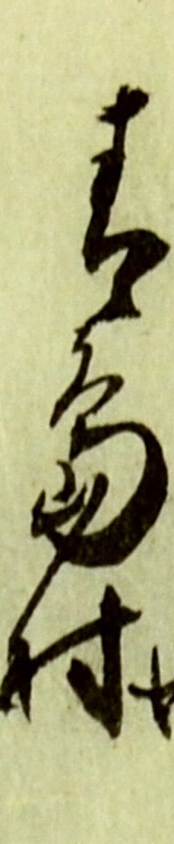青島村
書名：郷方掛合帳
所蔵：伊那市立高遠町図書館・合同会社AMANE
